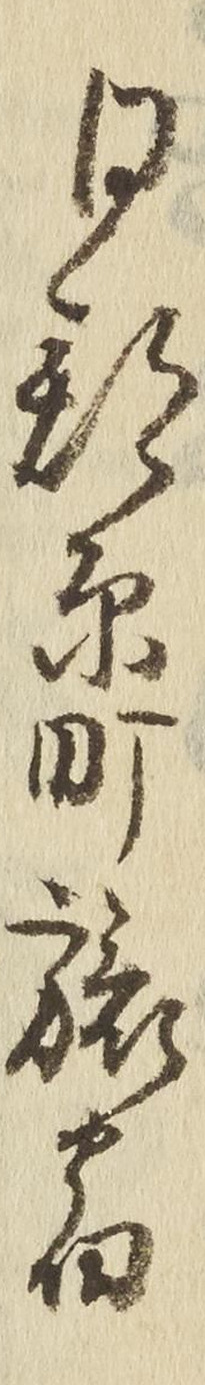同郡原町旅宿
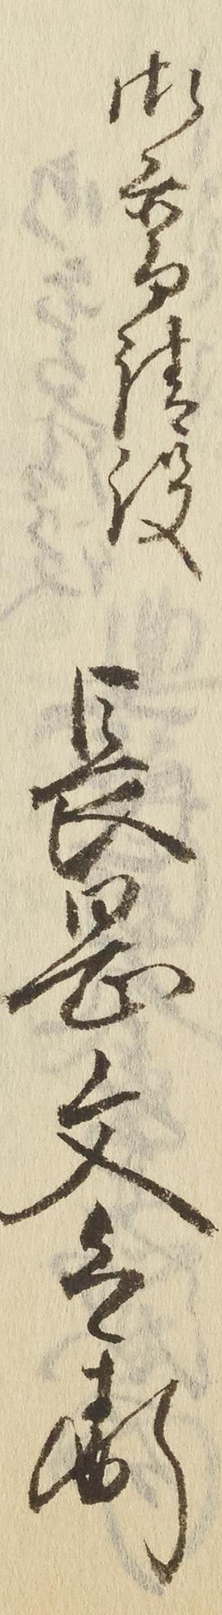御普請役長岡文兵衛
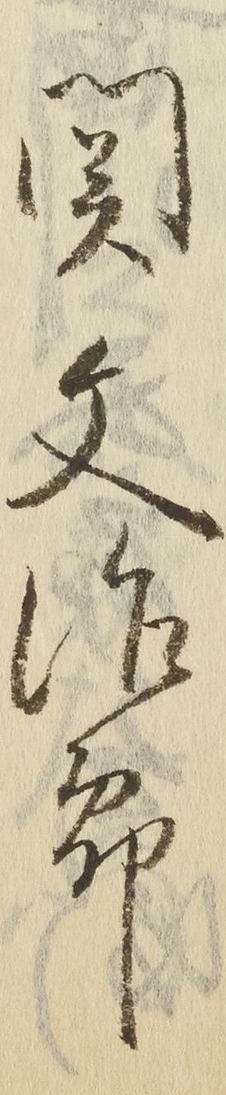関文次郎
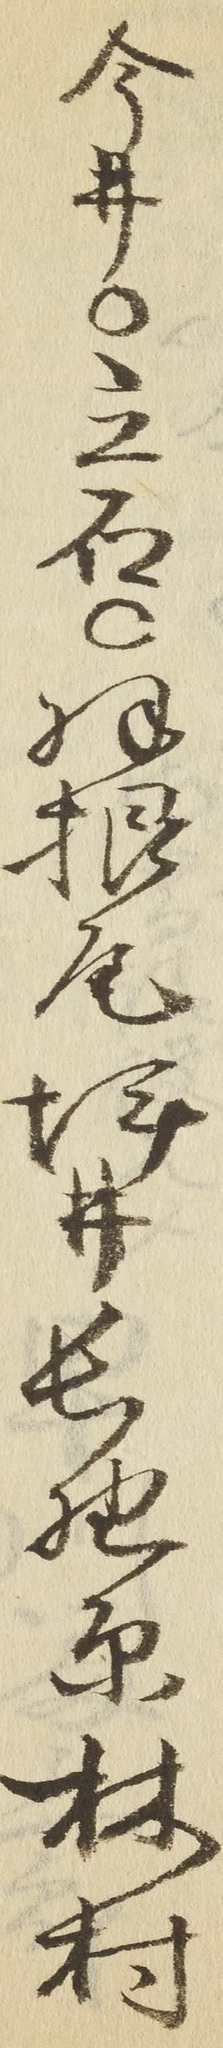今井◯立石◯羽根尾坪井長野原林村
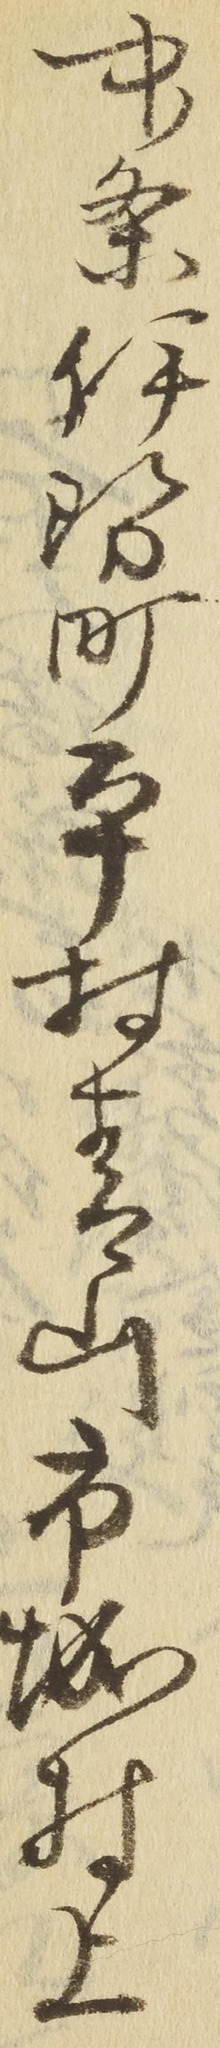中ノ条伊勢町平村青山市城村上
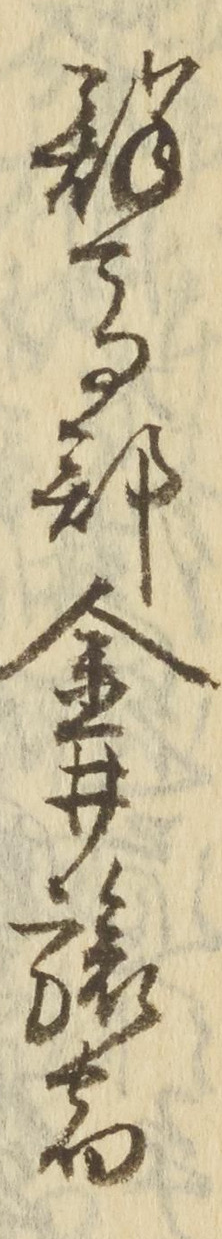群馬郡金井旅宿
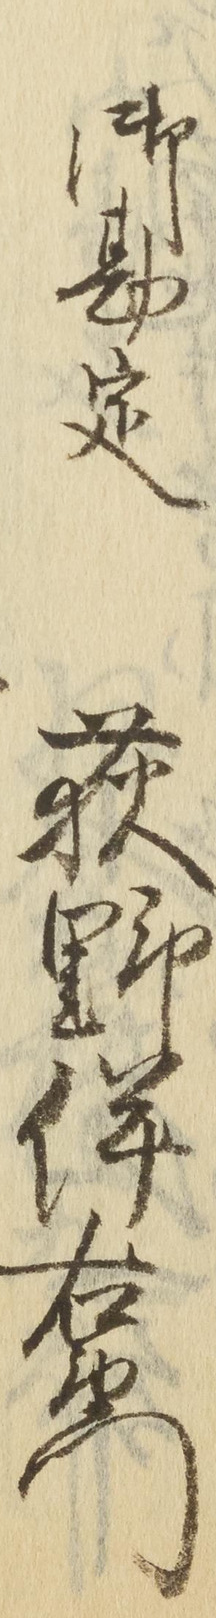御勘定萩野伴右衛門
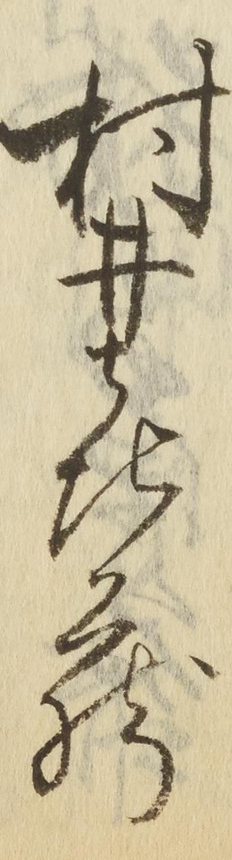村井喜蔵
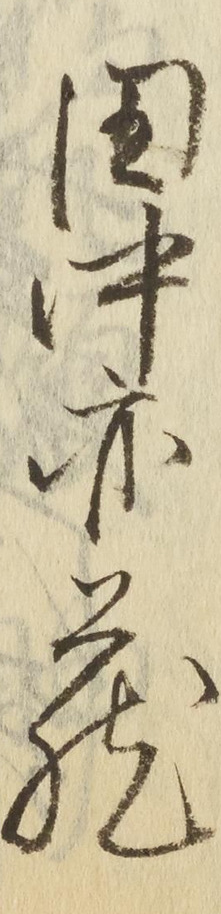田中亦蔵
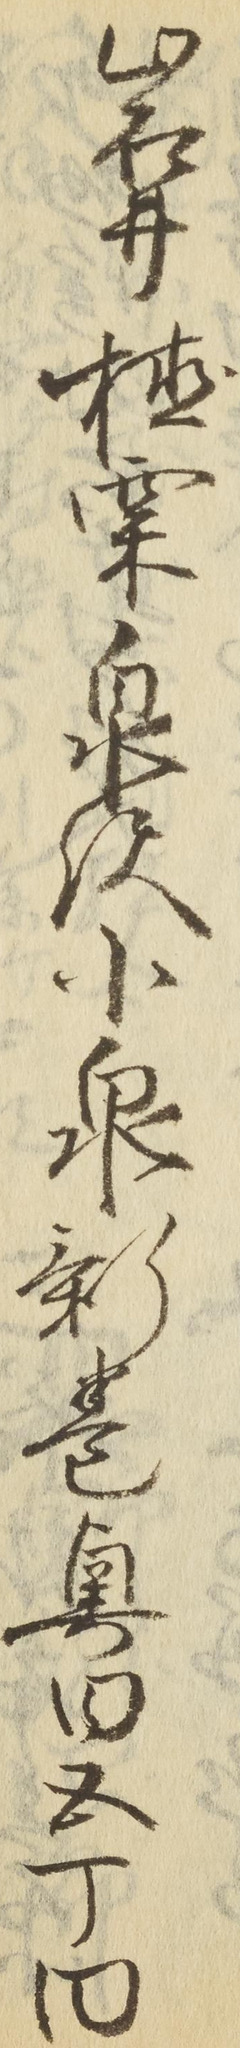岩井植栗泉沢小泉新巻奥田五丁田
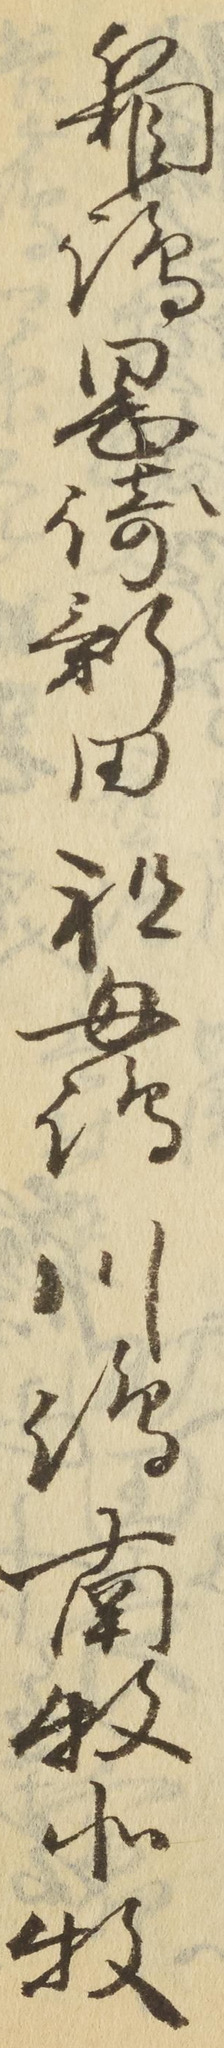箱嶋岡嶋新田祖母嶋川嶋南牧北牧
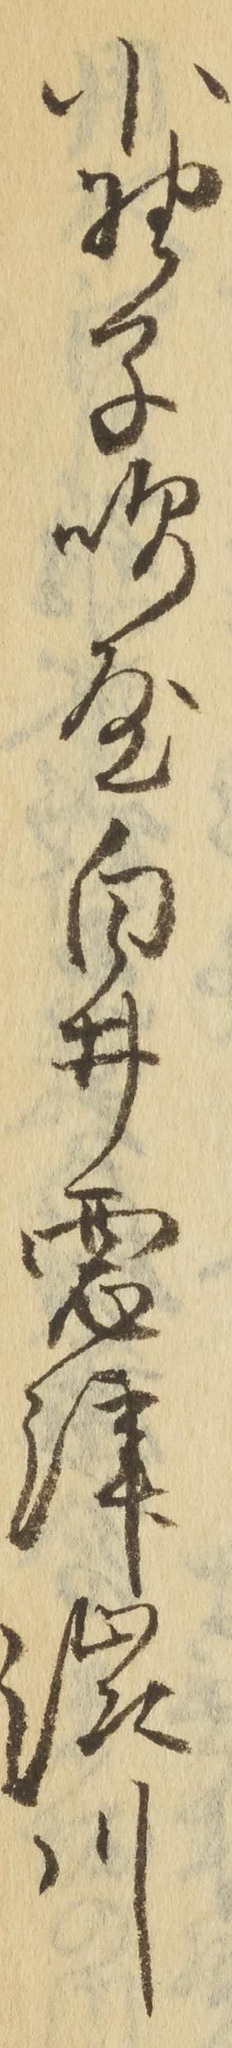小野子吹屋白井悪津渋川

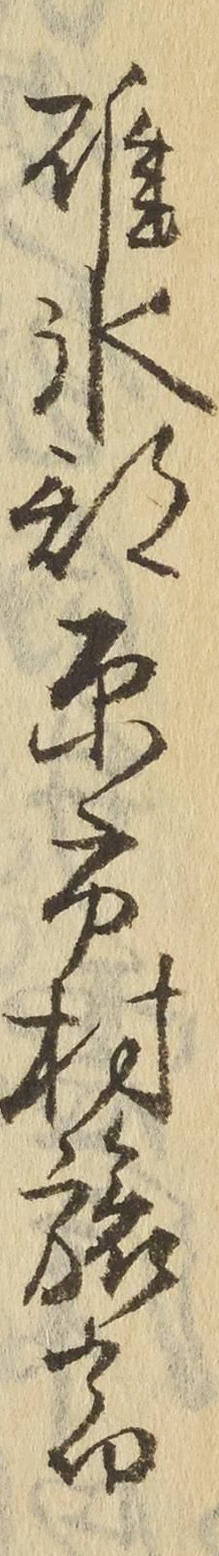碓氷郡原市村旅宿
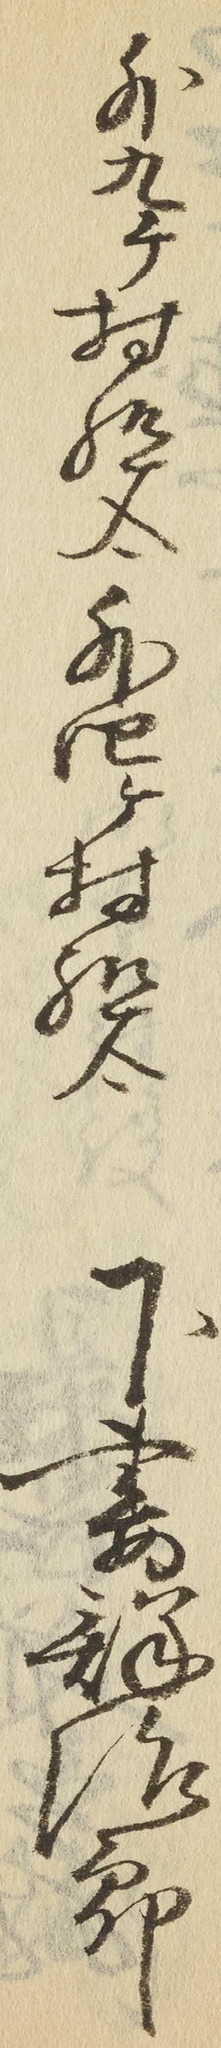外九ケ村組合外四ケ村組合下妻群治郎
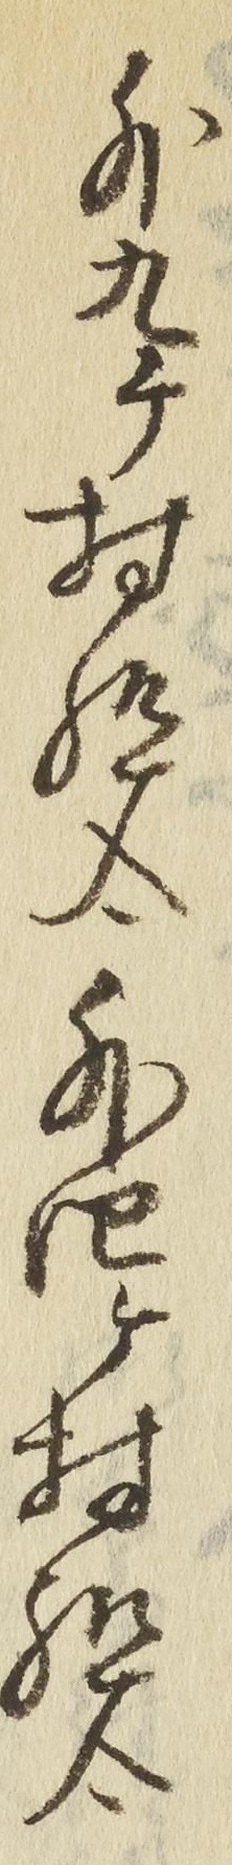拾一ヶ村組合外八ケ村組合
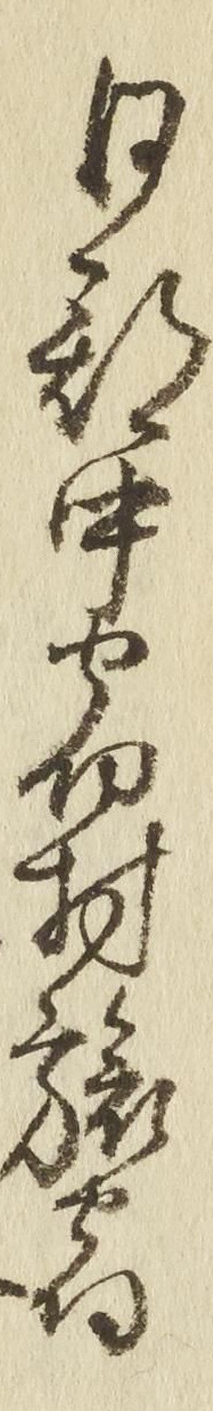同郡中富村旅宿
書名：浅間大變記
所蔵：東京大学地震研究所図書室 Earthquake Research Institute Library, The University of Tokyo, JAPAN
